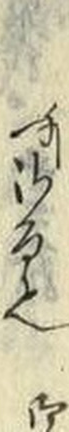金五百疋
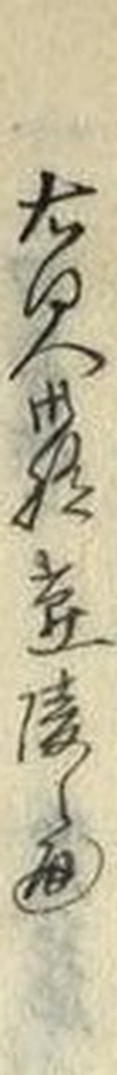右同人御賄燕凌之通
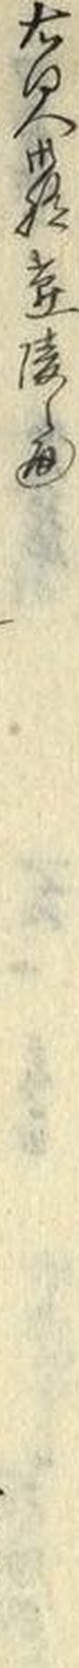右同人御賄燕凌之通
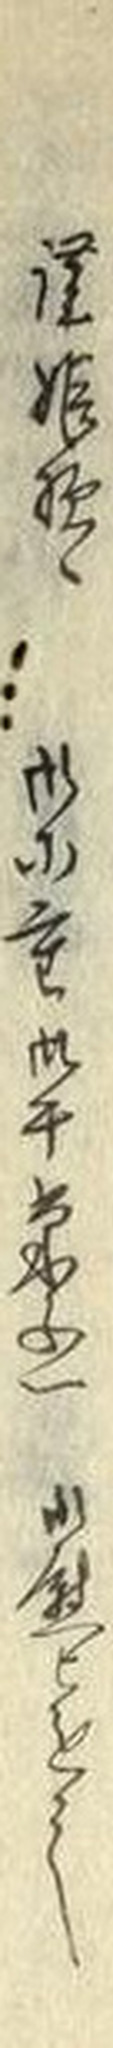謹姫様へ御小重御干菓子一御慰被進之
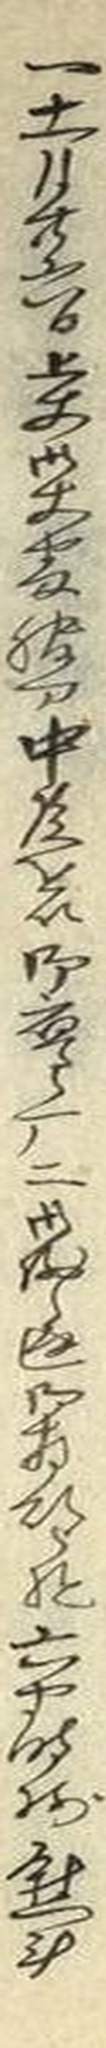一十一月廿六日上使御使番服部中殿を以御鷹之雁二御例之通御拝領被遊六半時揃熨斗
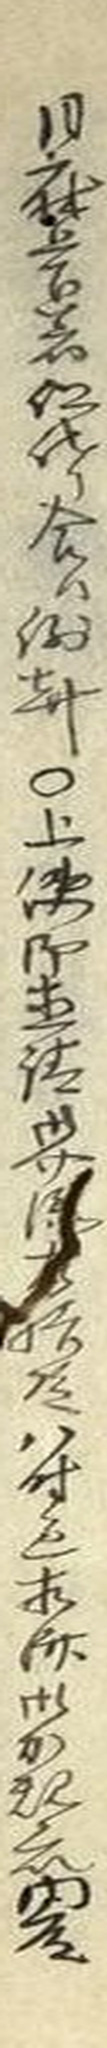目麻上下着但代り合ハ例刻〇上使御直請御介添左膳殿八時過相済御加規衆内藤
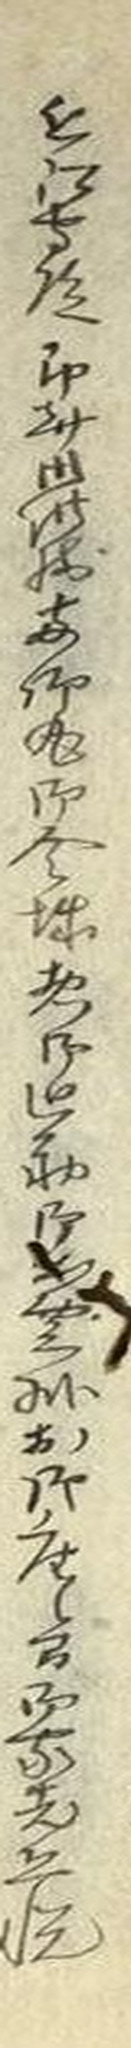近江守殿即刻御供揃両御丸御登城惣御廻勤御出殿掛於御座之間御家老恐悦
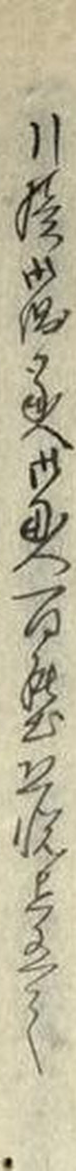引続御側御用人御用人一同罷出恐悦申上有之
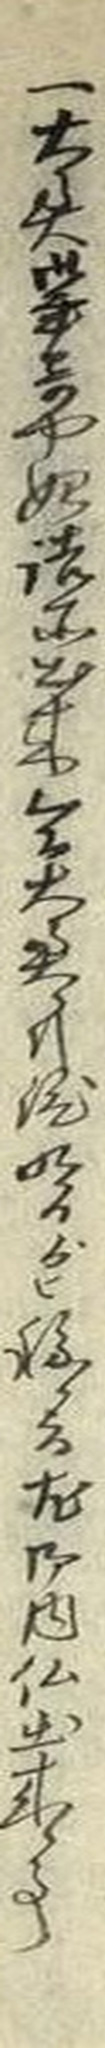一大奥御年寄中始詰所出来今日大奥へ引渡明日ゟ被移候旨尤御内仏出来候事
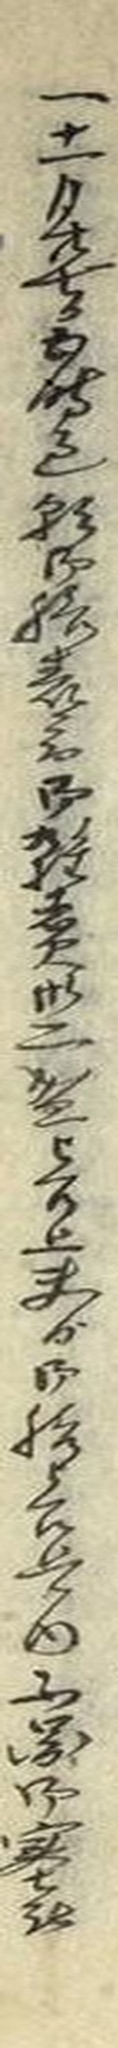一十一月廿七日五時過朝御膳表ニ而御雑煮御二盛被召上夫ゟ御膳被召上候内不図御塞被
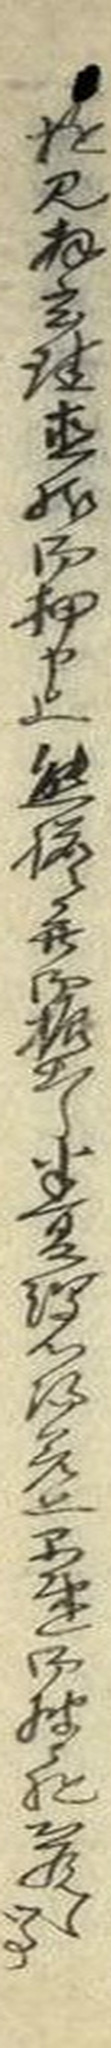遊見拝玄珪直様御押申上熊膽幷御振出し半夏瀉心湯差上早速御披被遊恐悦之御事

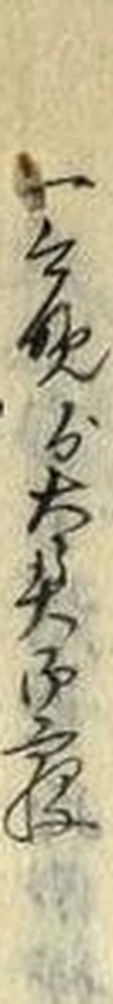一今晩ゟ大奥御寝
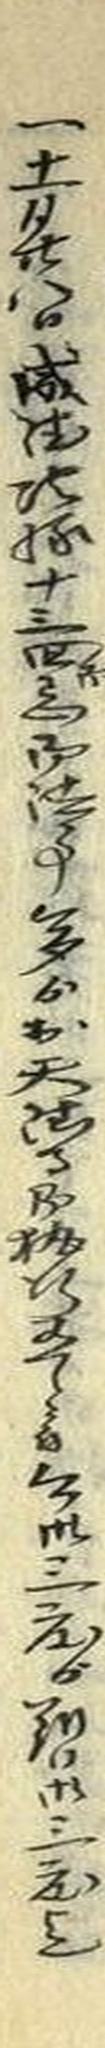一十一月廿八日威徳院様十三回御忌御法事今夕ゟ於天徳寺御執行有之ニ付今御三度ゟ朔日御三度迄
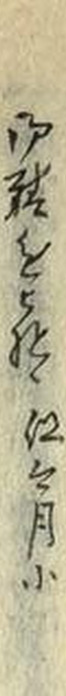御精進被遊候但今月小
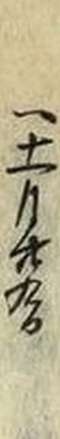一十一月廿九日
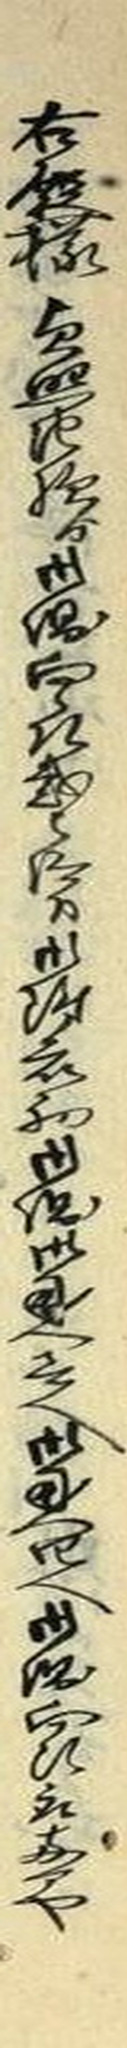右殿様貞照院様ゟ御側向頂戴被仰付御附衆初御側御用人壱人御用人四人御側向頭取両部屋
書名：少傅日録抄（斉善付側向頭取日記、在府）
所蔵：福井県文書館 Fukui Prefectural Archives
